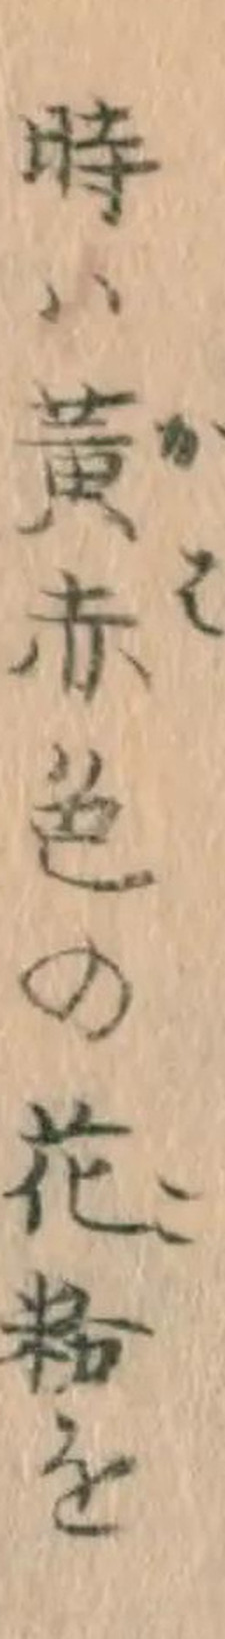時は黄赤色の花粉を
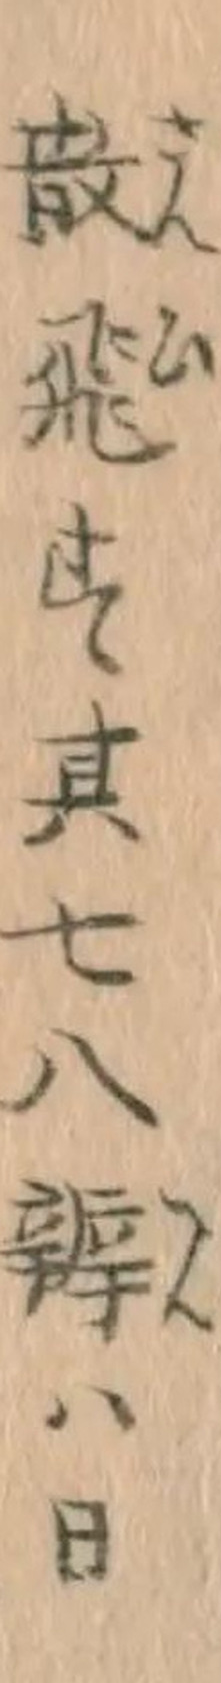散飛す其七八弁は日
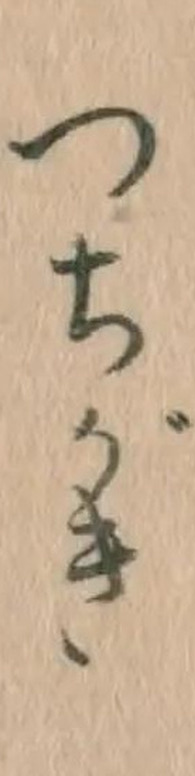つちがき
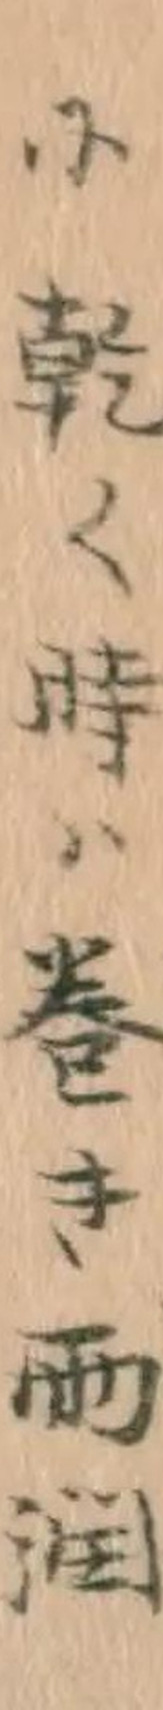に乾く時は巻き雨潤
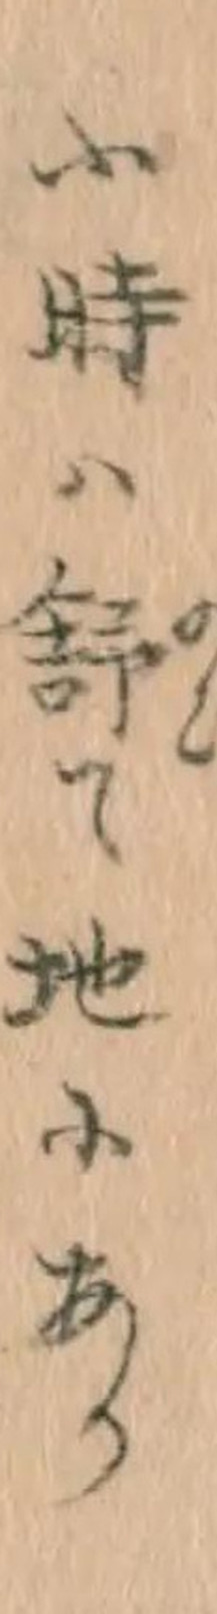ふ時は舒て地にあり
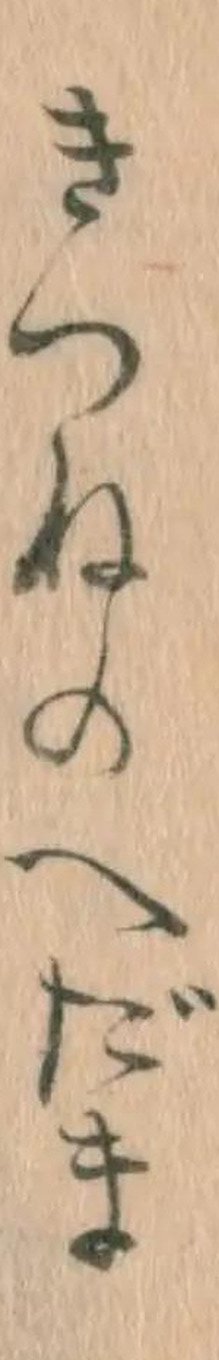きつねのへだま
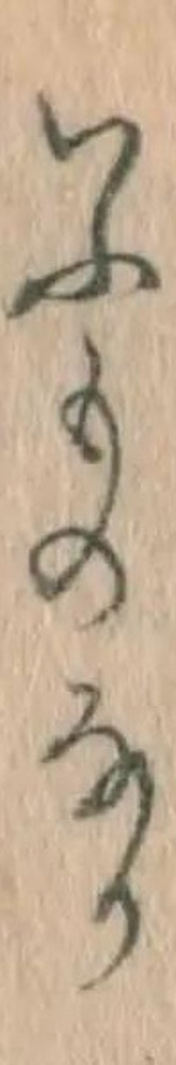いふものなり

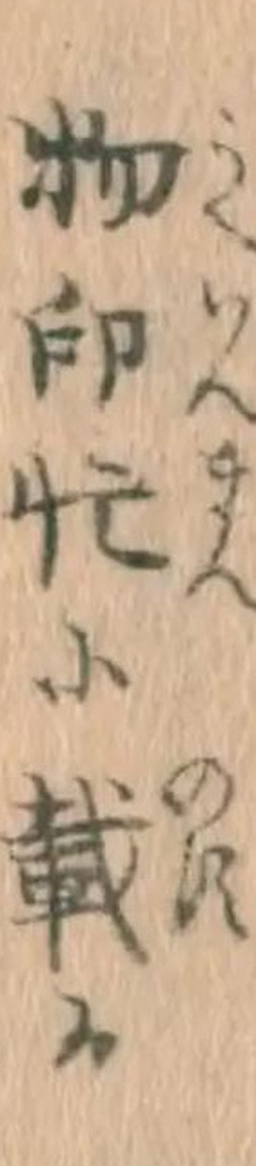物印忙に載る
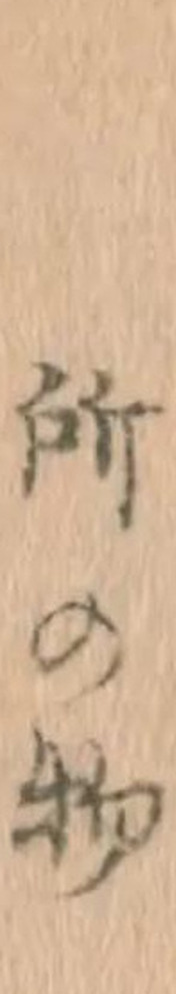所の物
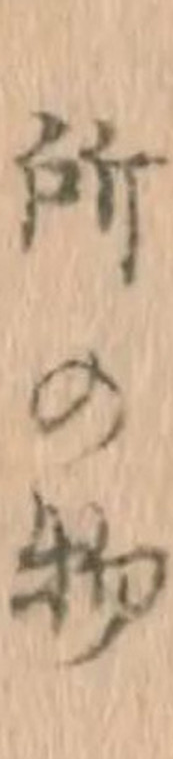所の物

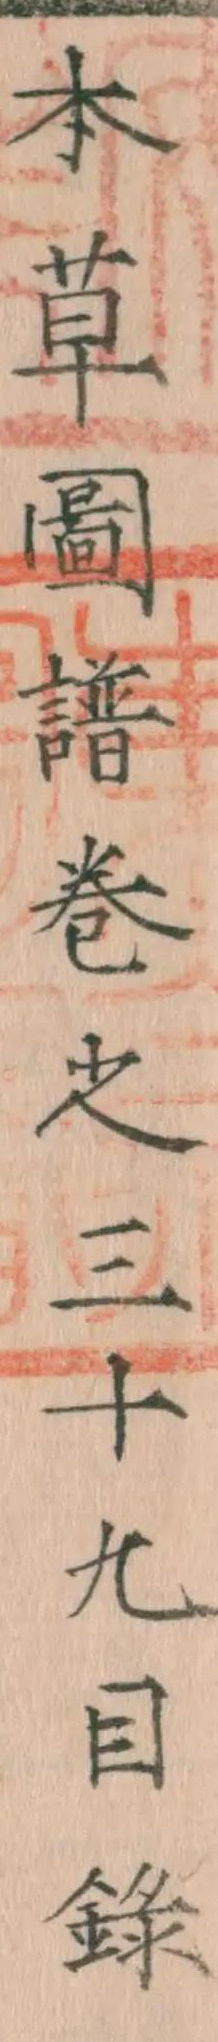本草図譜巻之三十九目録

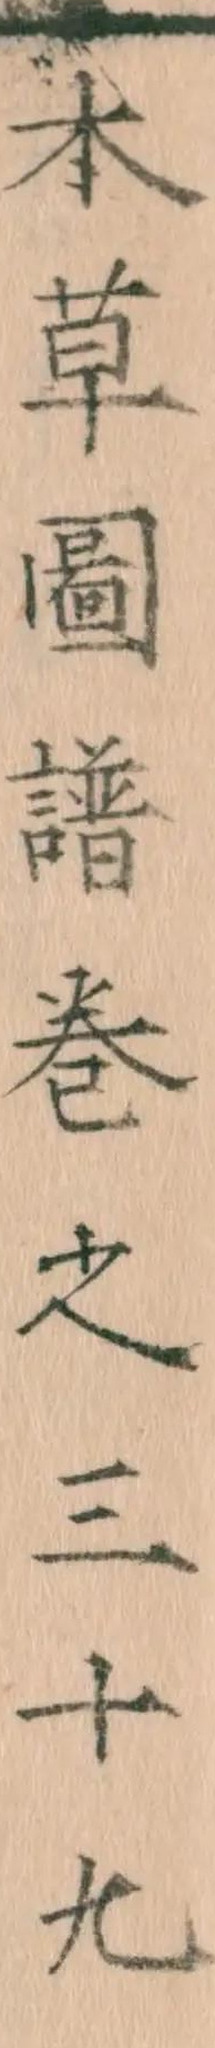本草図譜巻之三十九
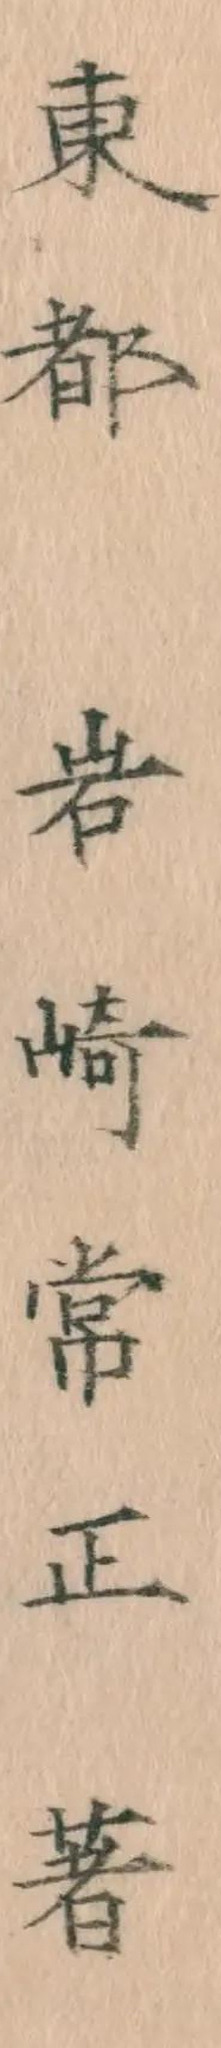東都岩崎常正著
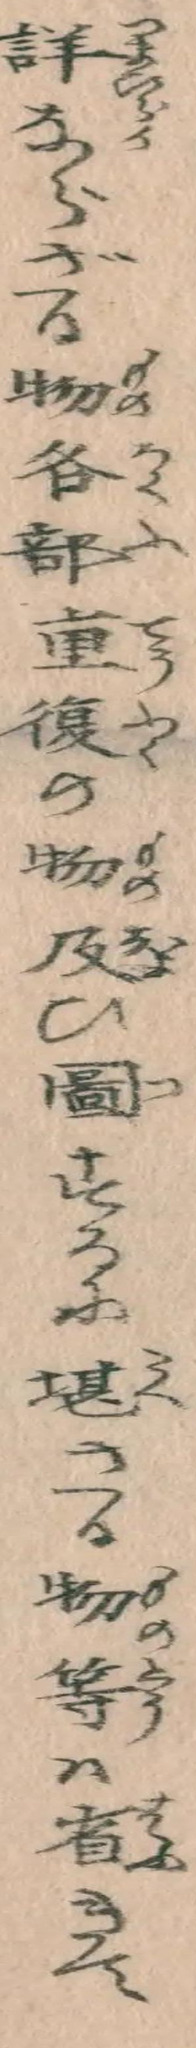詳ならざる物各部重復の物及ひ図するに堪さる物等は省きて

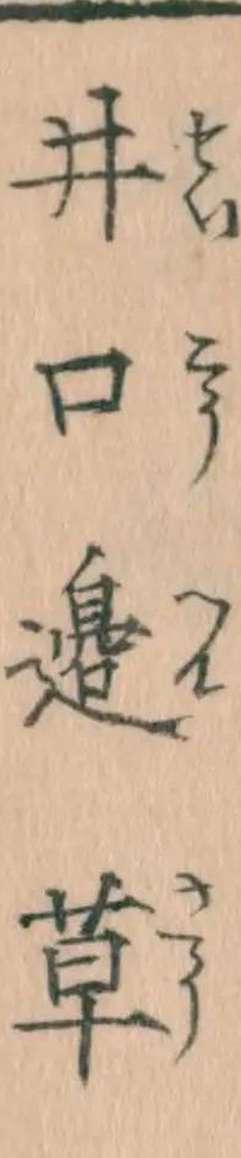井口辺草
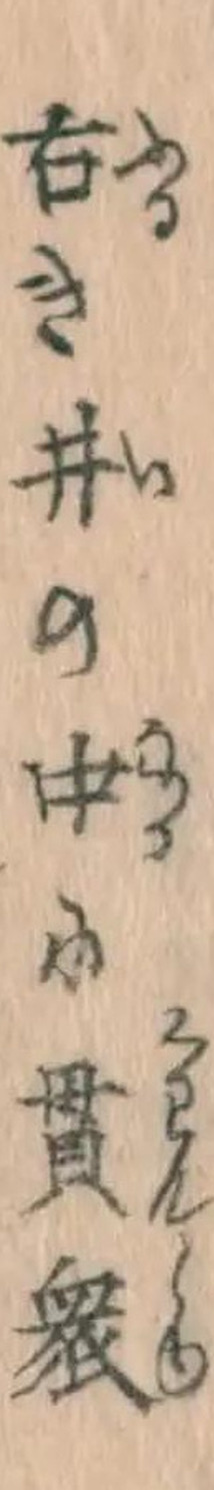古き井の中に貫衆
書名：本草図譜. 巻37-39
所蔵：国立国会図書館 National Diet Library, JAPAN
